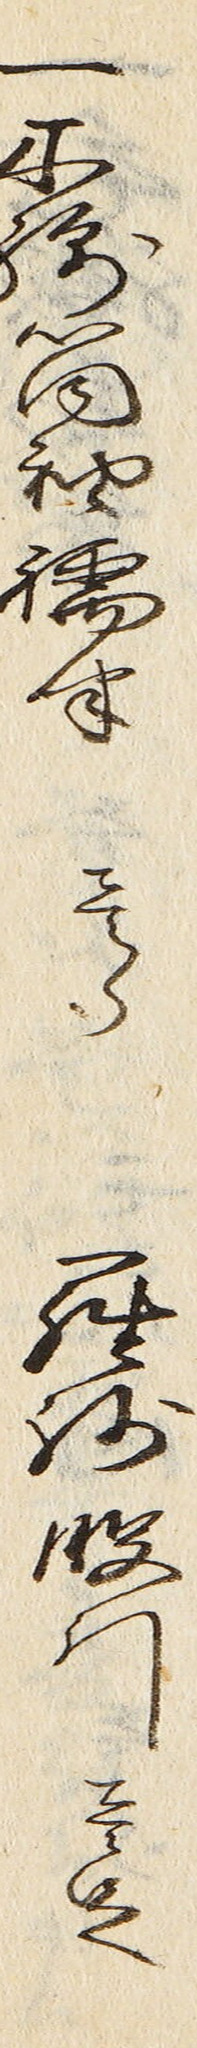一木綿筒袖襦半壱ツ羅紗股引壱足
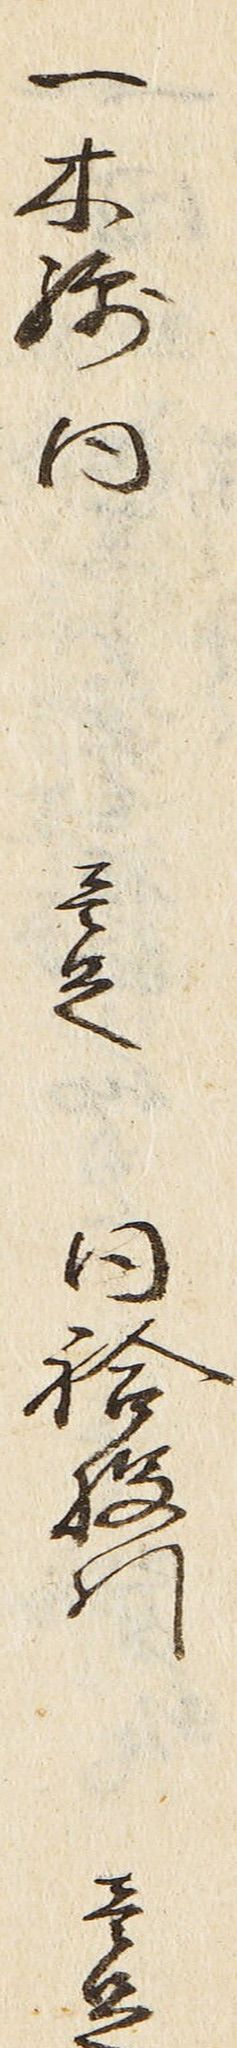一木綿同壱足同袷股引壱足
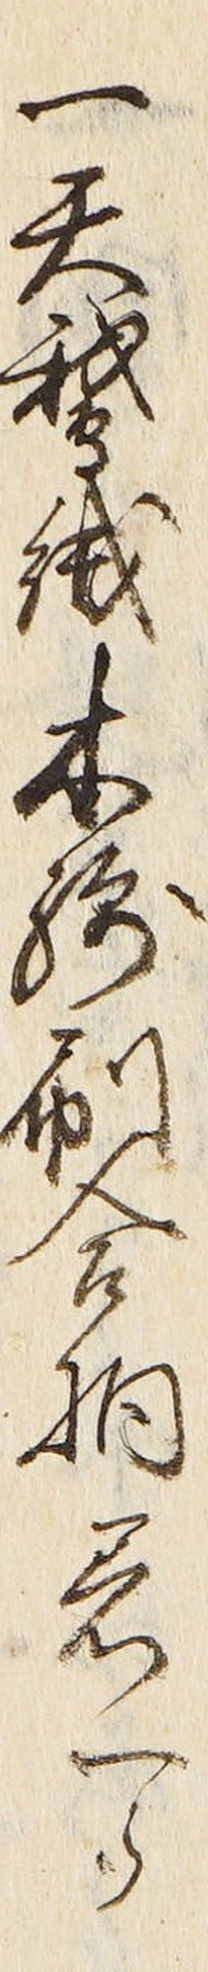一天鵞絨木綿刷合胴着一ツ
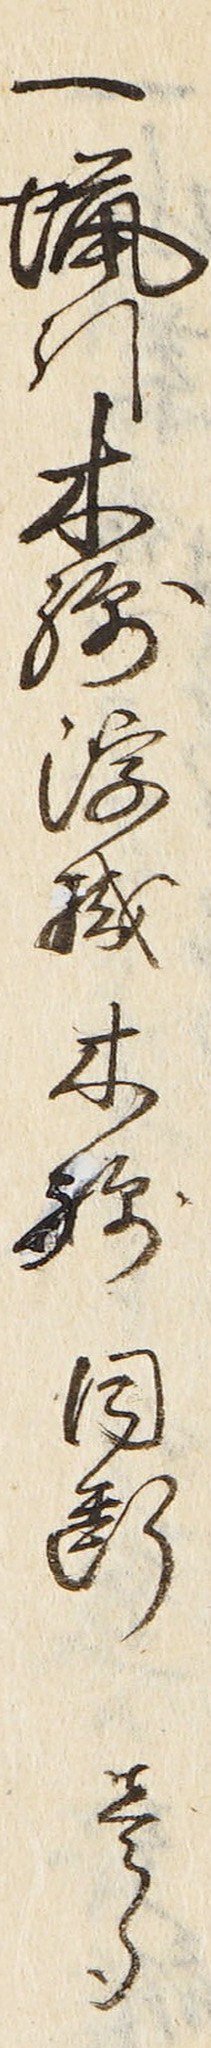一蝋引木綿浮織木綿同断壱ツ
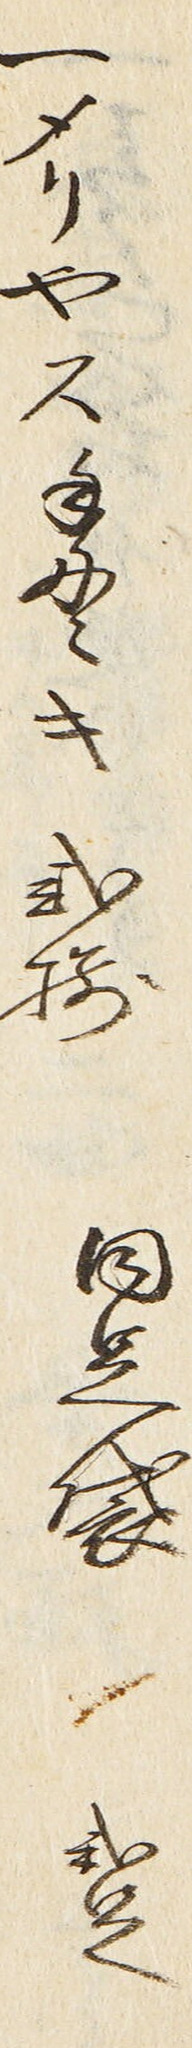一メリヤス手貫キ弐揃同足袋弐足
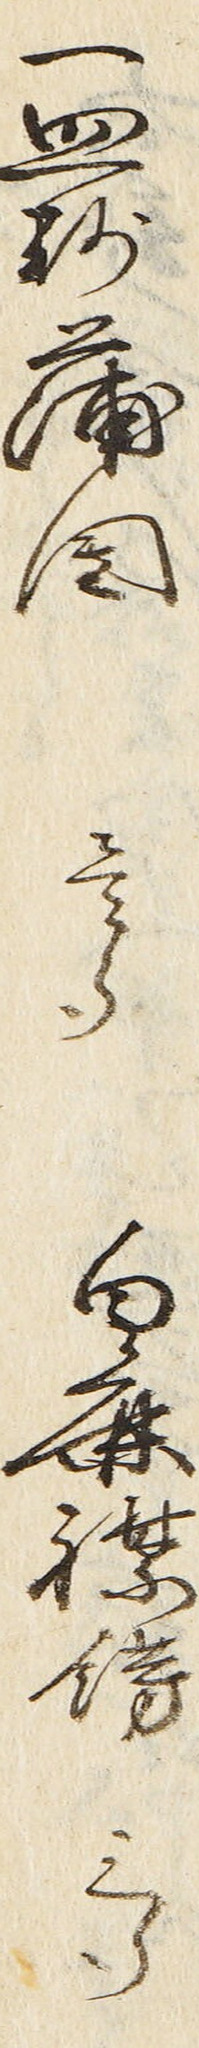一皿紗蒲団壱ツ白鹿襟餝三ツ
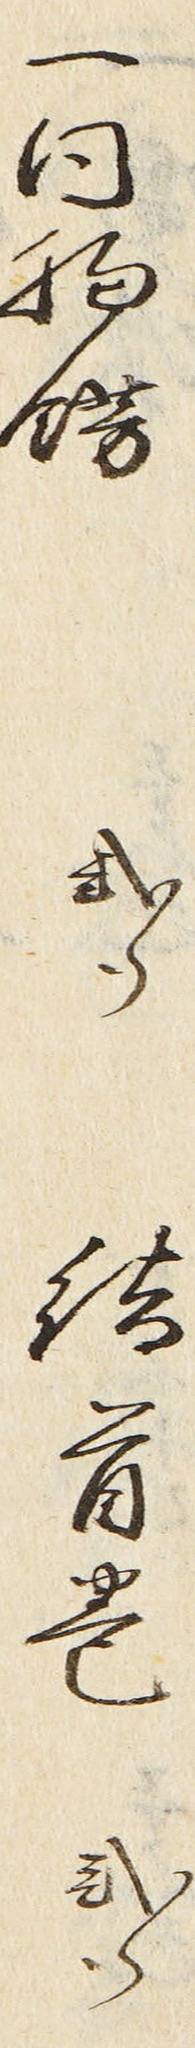一同胸餝弐ツ結首巻弐ツ
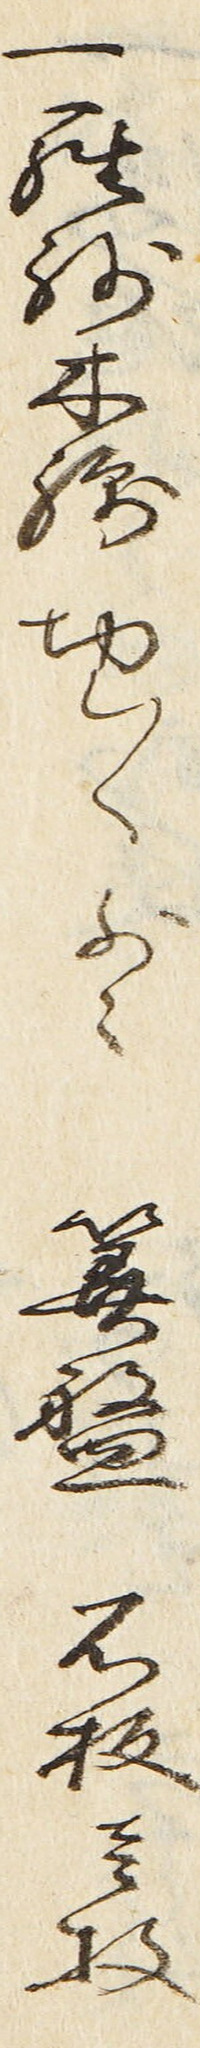一羅紗木綿切れ〳〵少々算盤石板壱枚
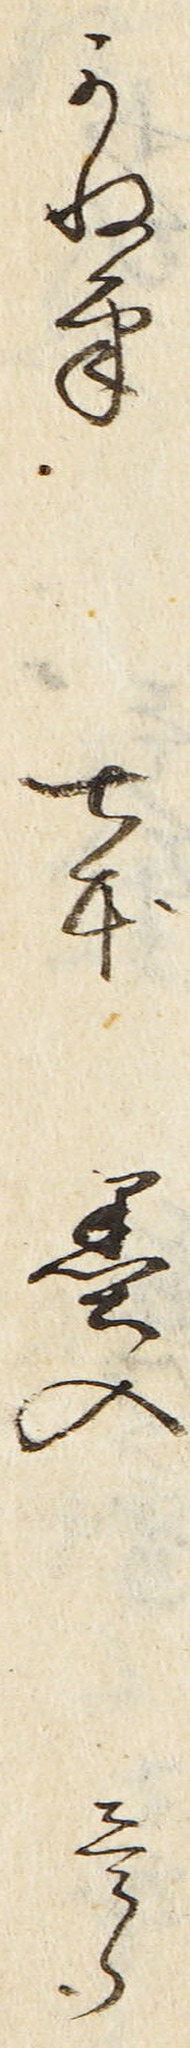一かね筆七本墨入壱ツ

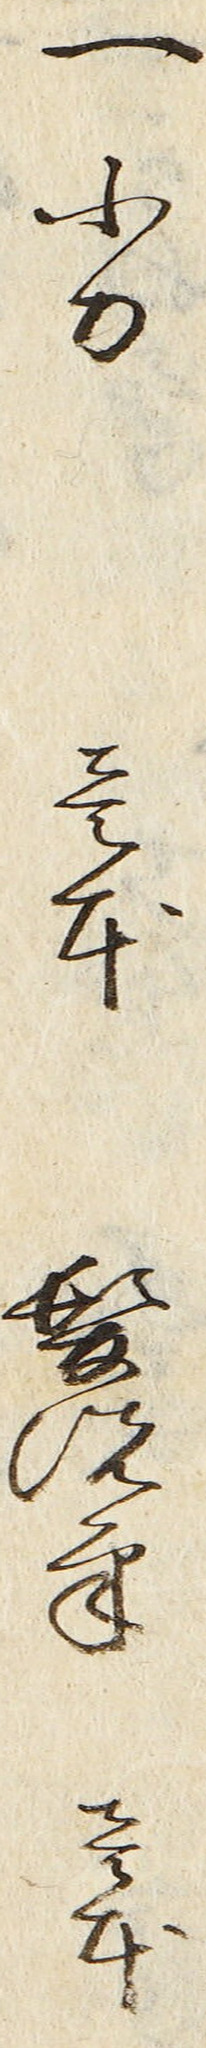一小刀壱本髪洗筆壱本
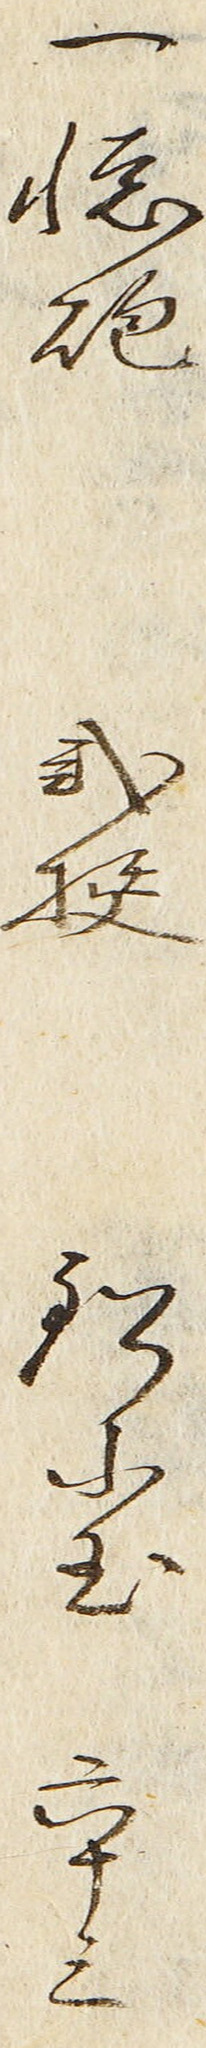一懐砲弐挺鉛小玉六十三
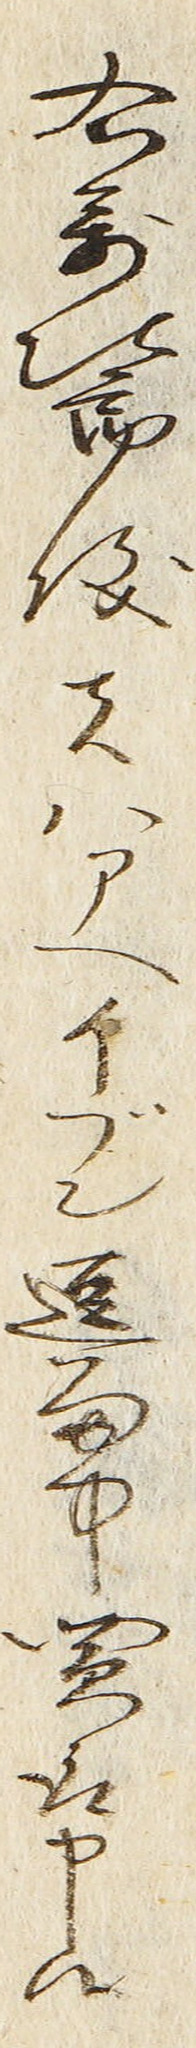右万次郎儀はハアヘイブン逗留中買取申候
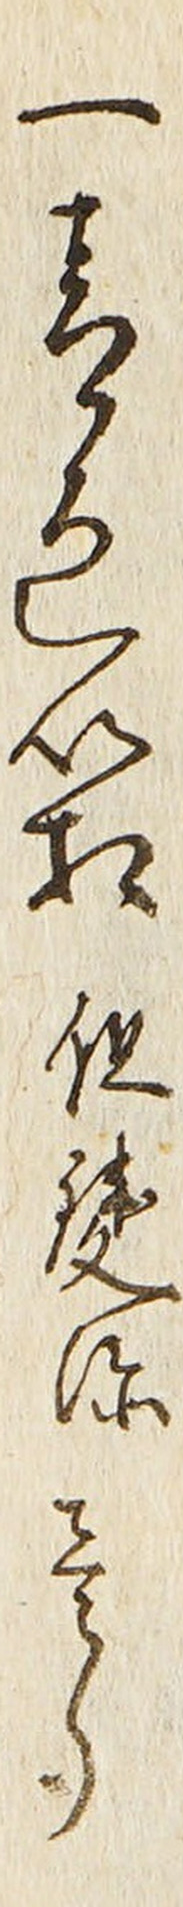一青色箱但鍵添壱ツ
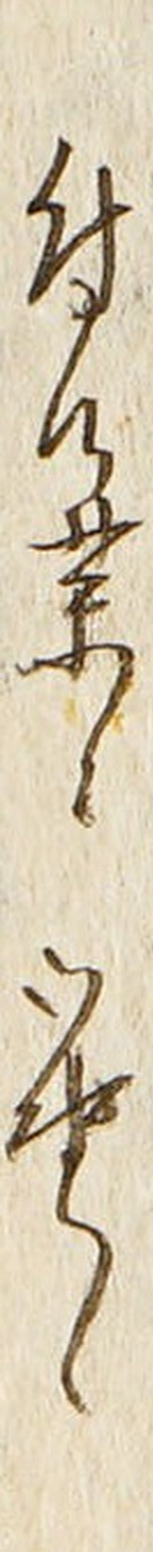付候薬に御坐候
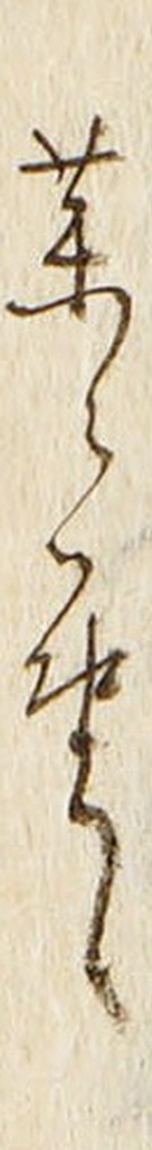薬に御坐候
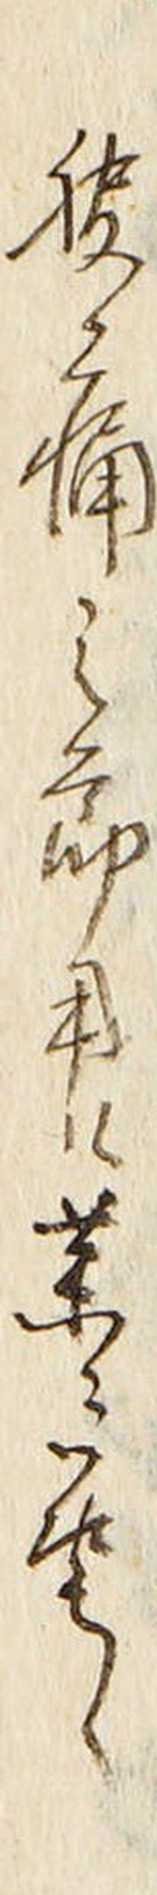腹痛之節用候薬に御坐候
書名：土佐中浜万次郎漂流記
